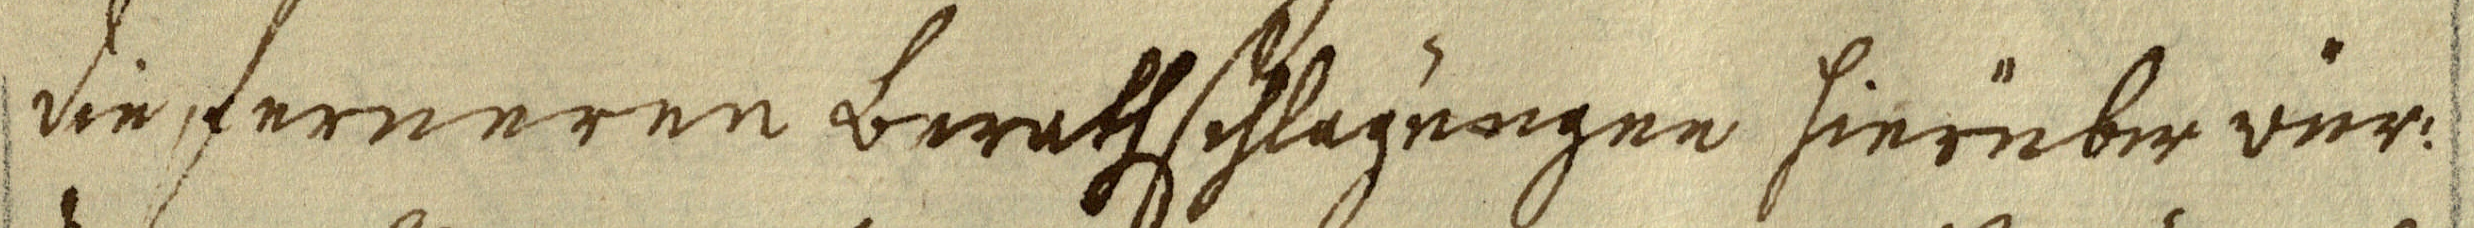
die ferneren Berathschlagungen hierüber wür¬
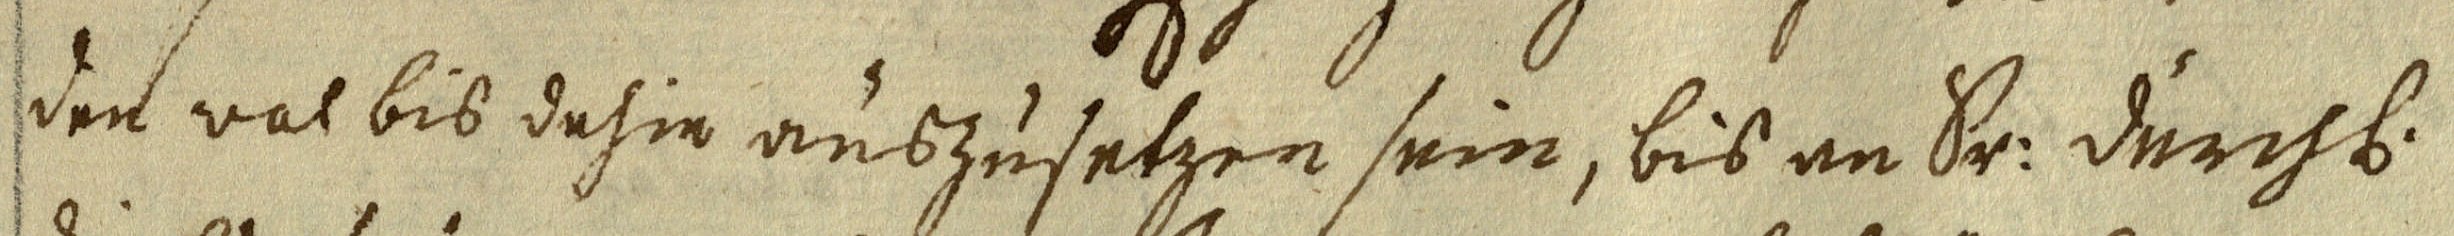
den wol bis dahin auszusetzen sein, bis an Sr Durchl.
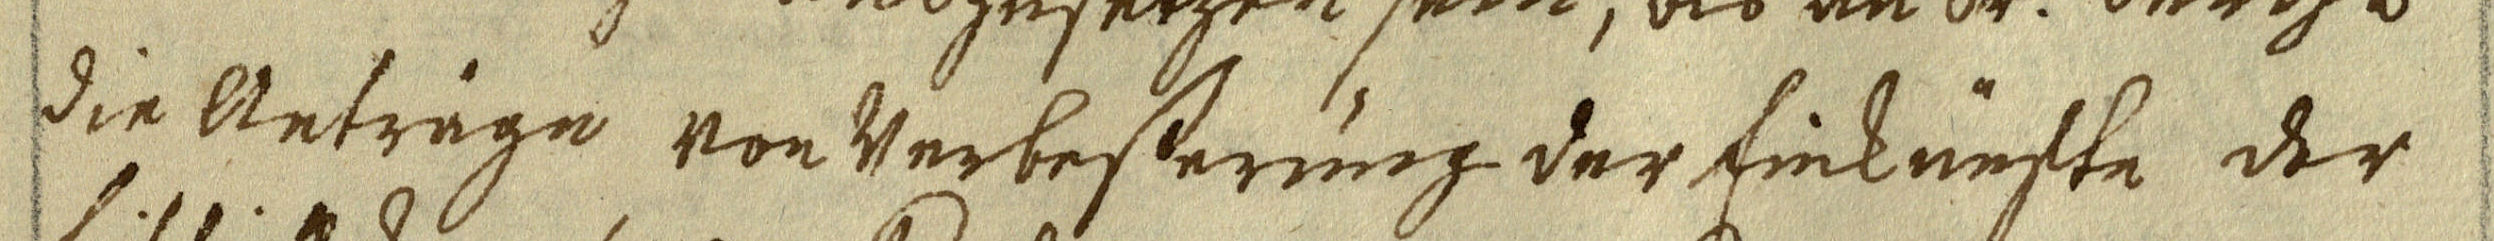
die Anträge von Verbeßerung der Einkünfte der
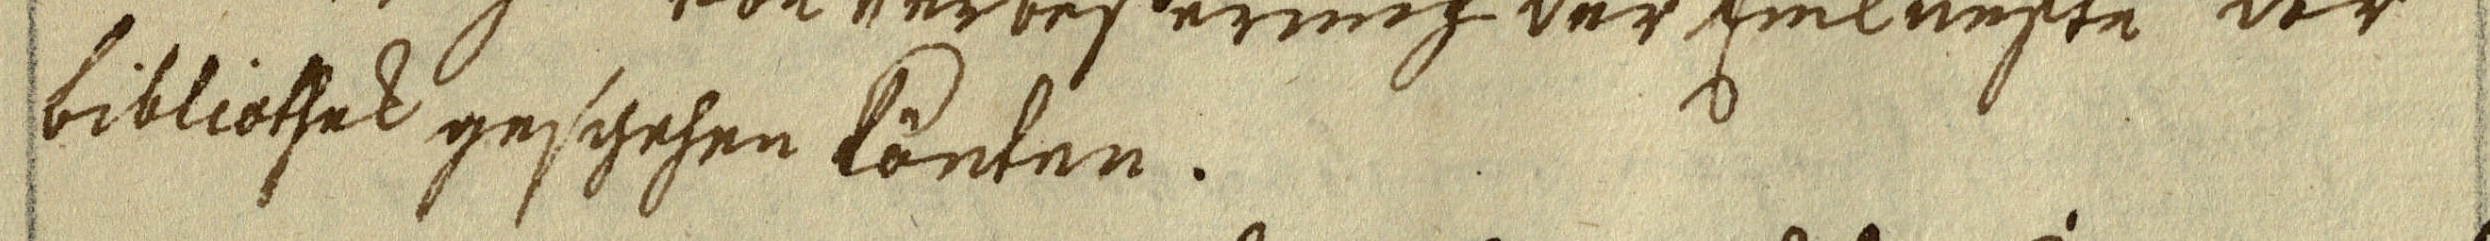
Bibliothek geschehen könten.
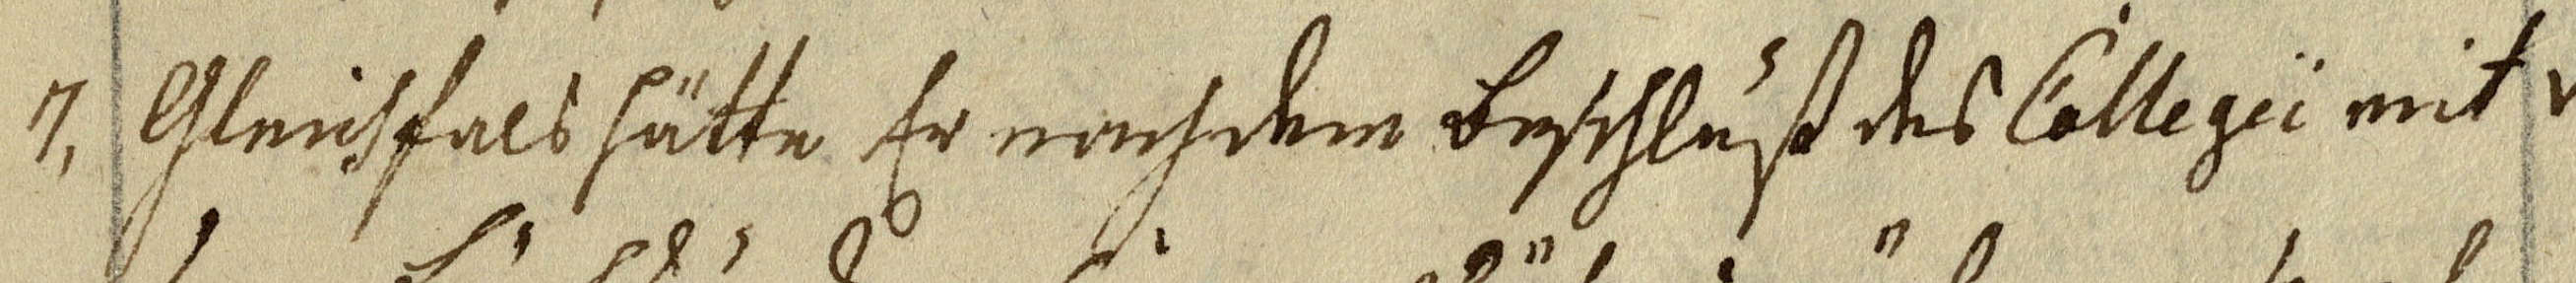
7. Gleichfals hätte Er nach dem Beschluß des Collegii mit
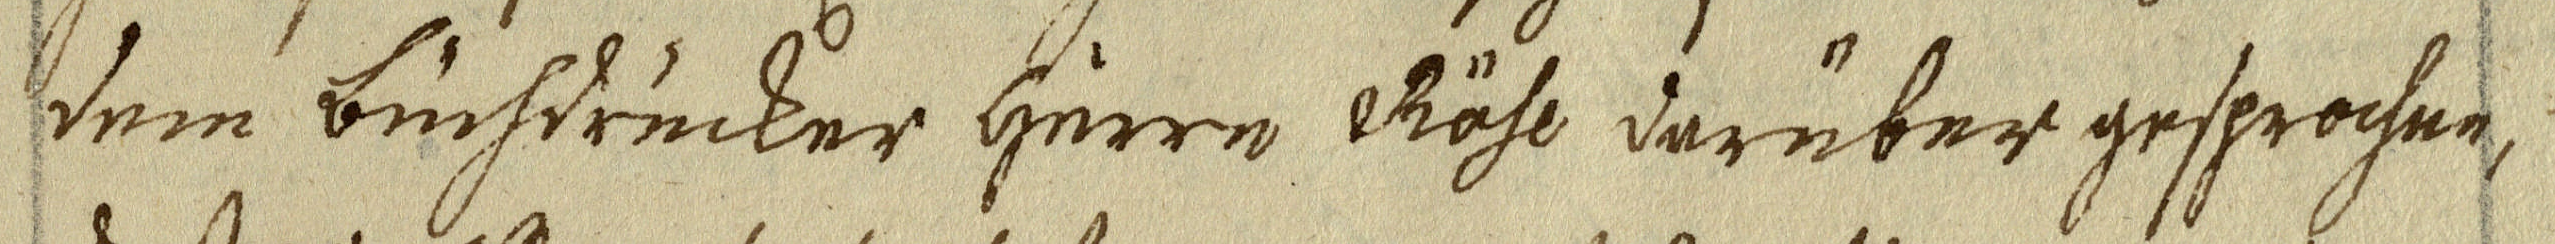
dem Buchdrucker Herrn Röse darüber gesprochen,
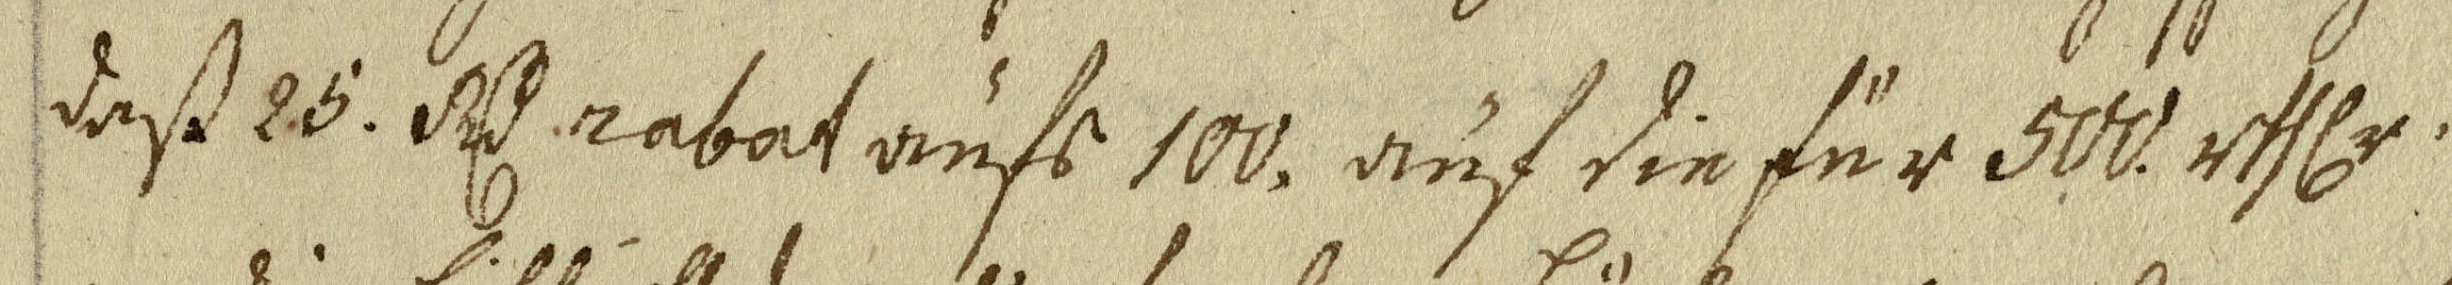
daß 25 Rt. rabat aufs 100. auf die für 500. rthlr.
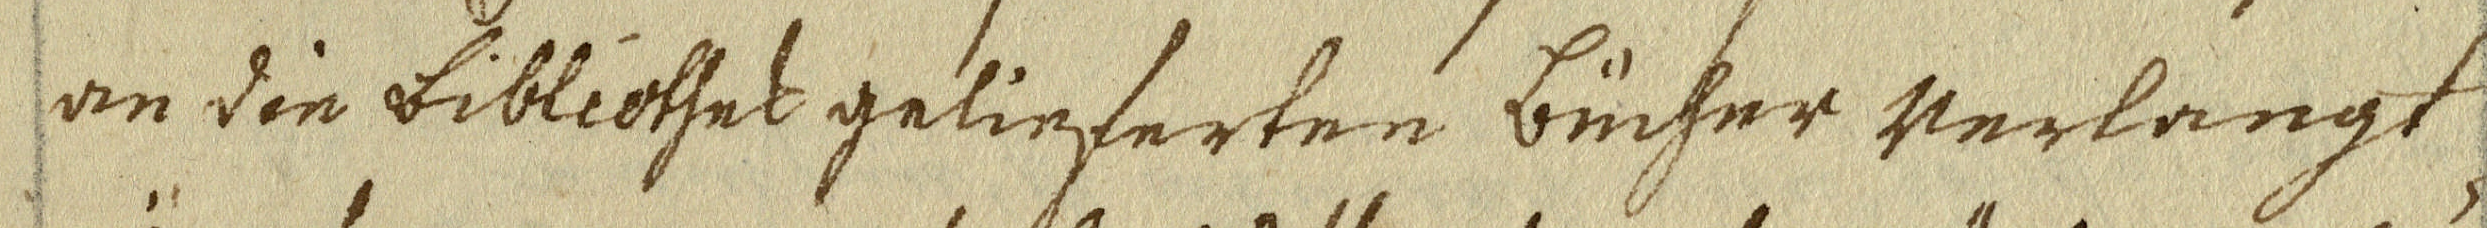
an die Bibliothek gelieferten Bücher verlangt
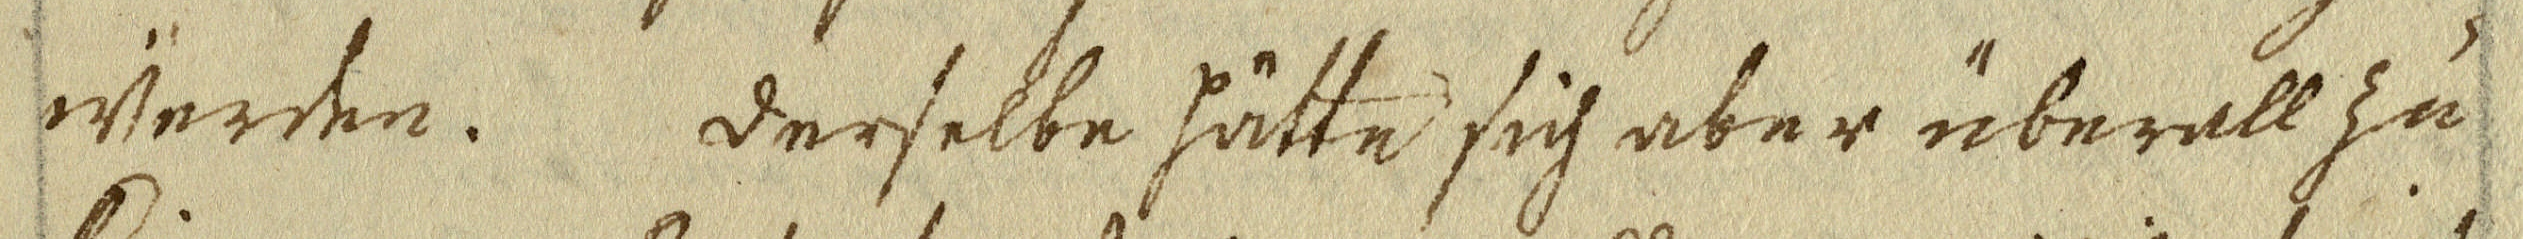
würden. Derselbe hätte sich aber überall zu
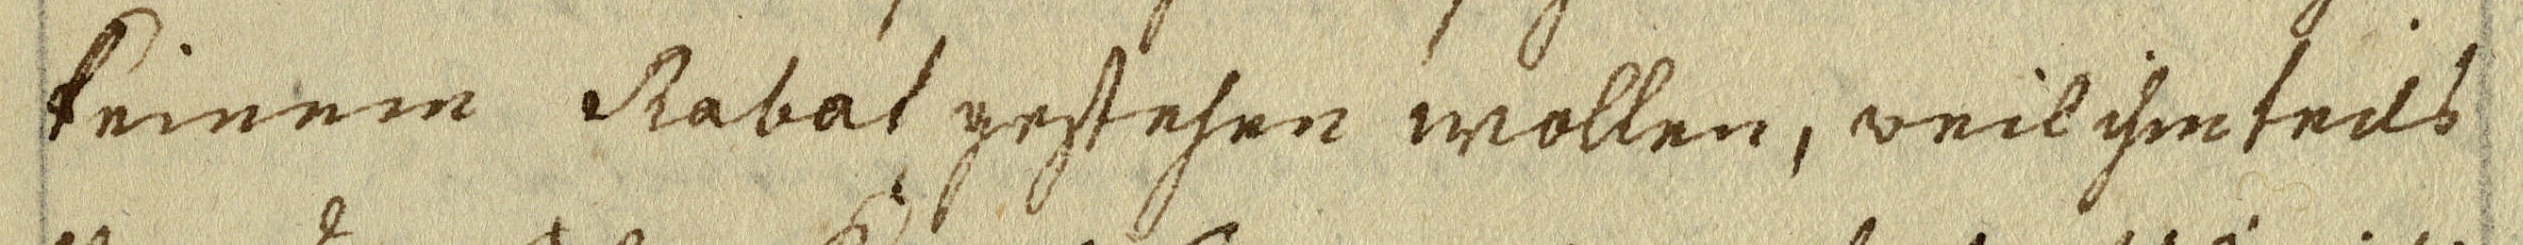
keinem Rabat gestehen wollen, weil ihm teils
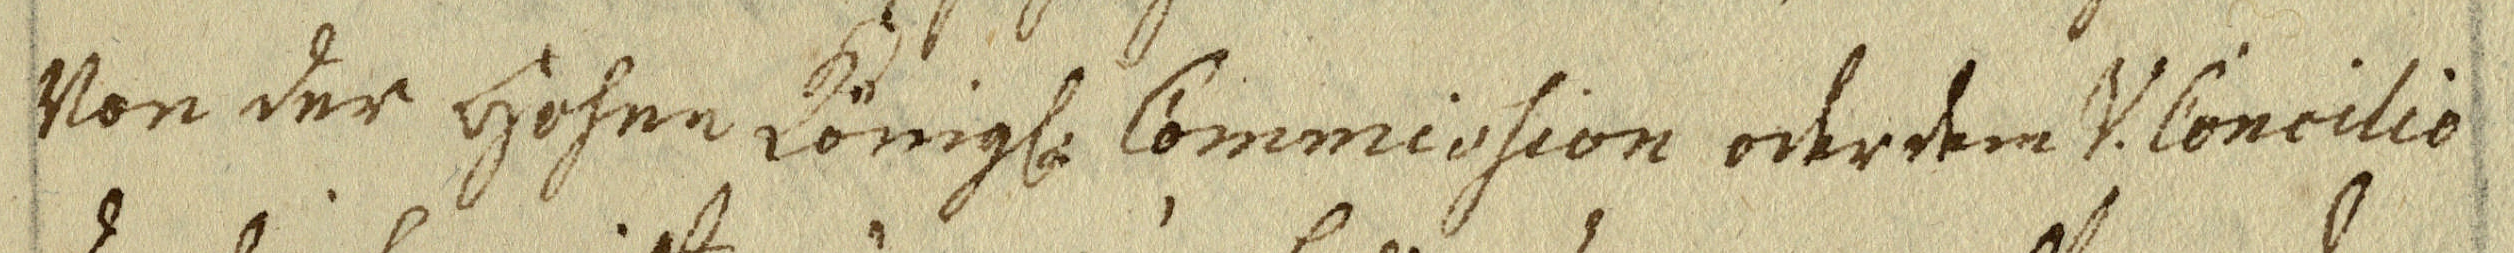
von der Hohen Königl. Commission oder dem V. Concilio
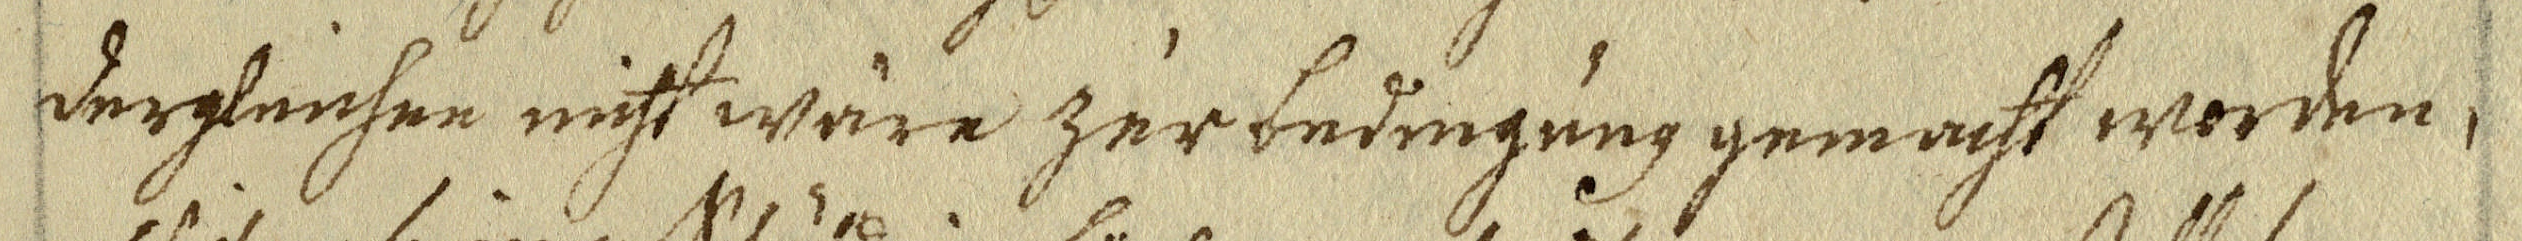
dergleichen nicht wäre zur Bedingung gemacht worden,
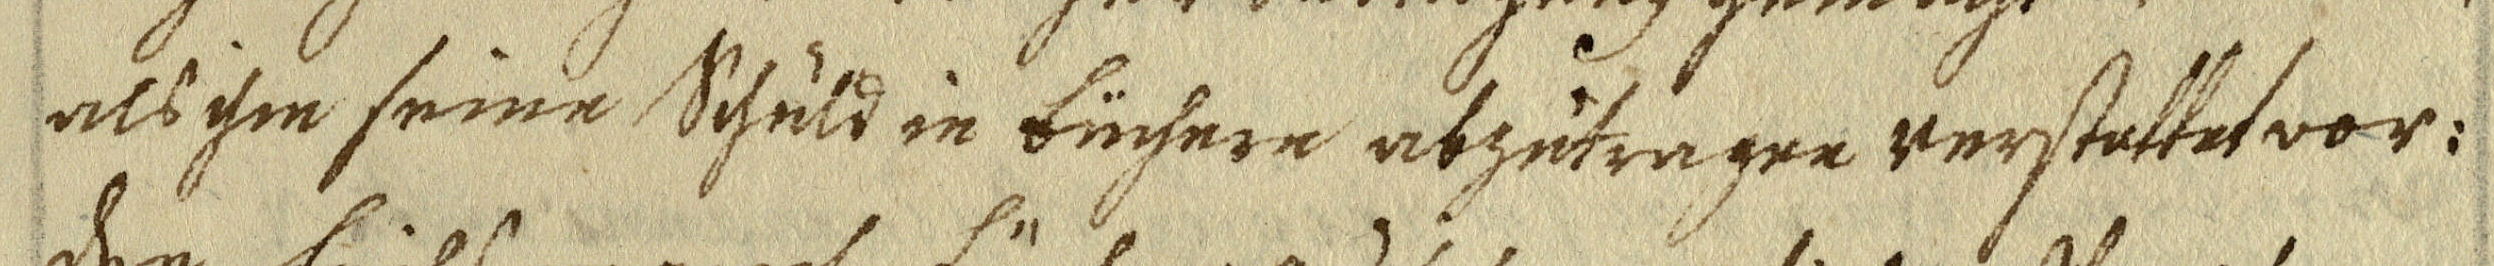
als ihm seine Schuld in Büchern abzutragen verstattet wor¬
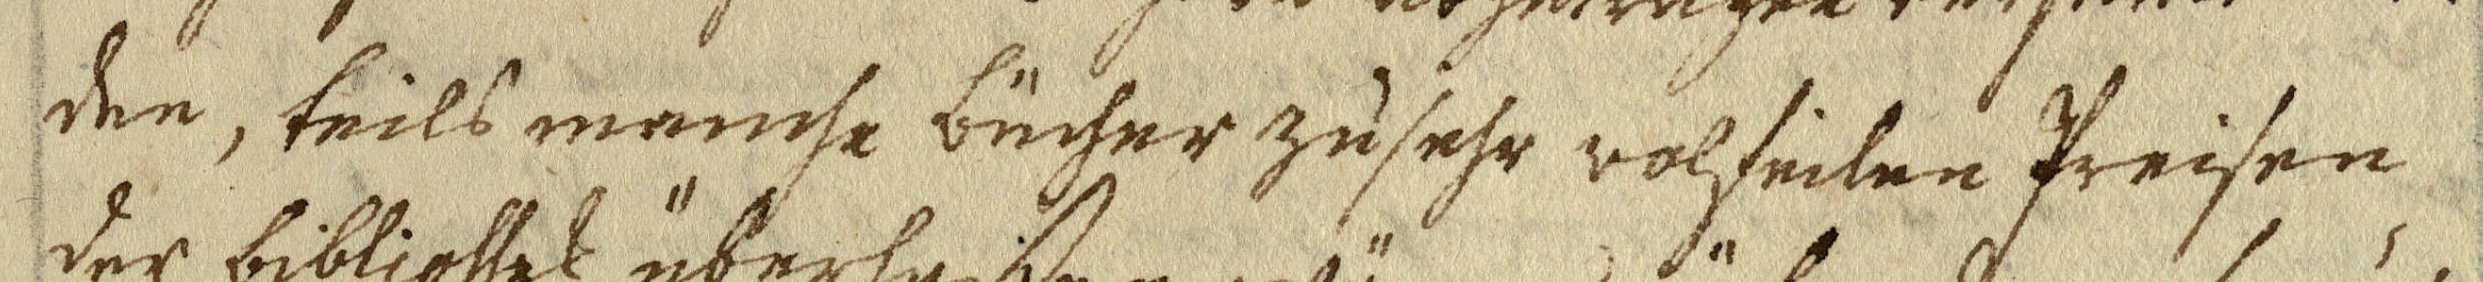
den, teils manche Bücher zu sehr wolfeilen Preisen
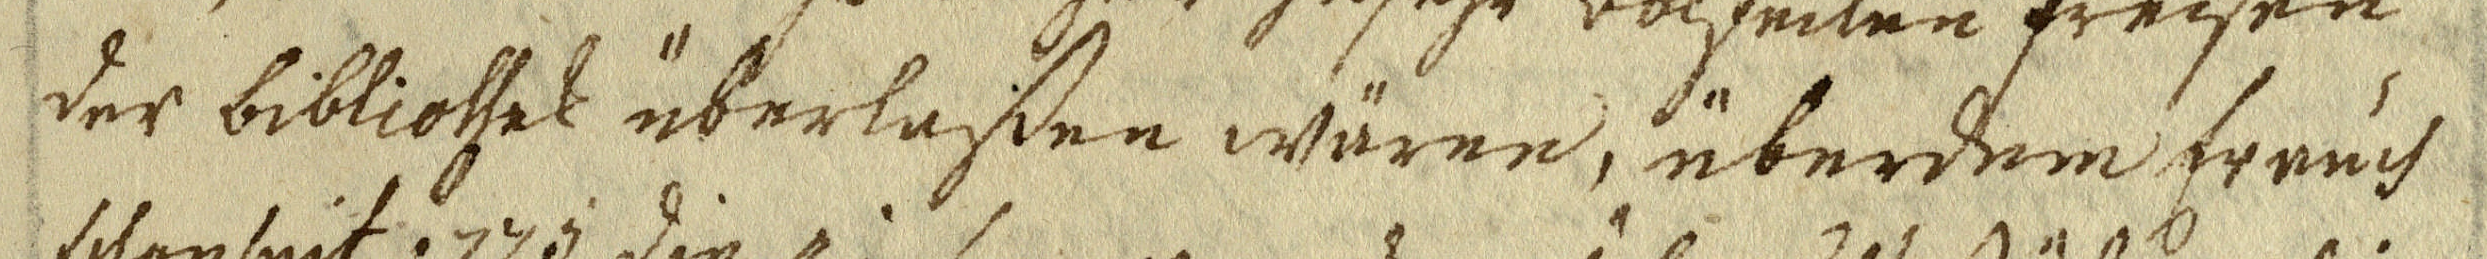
der Bibliothek überlaßen wären, überdem Er auch
